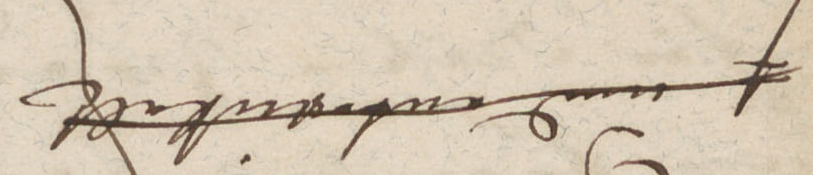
so wie diees damit verbundenen
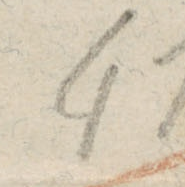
%
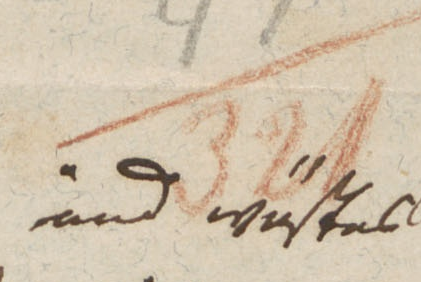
So erst
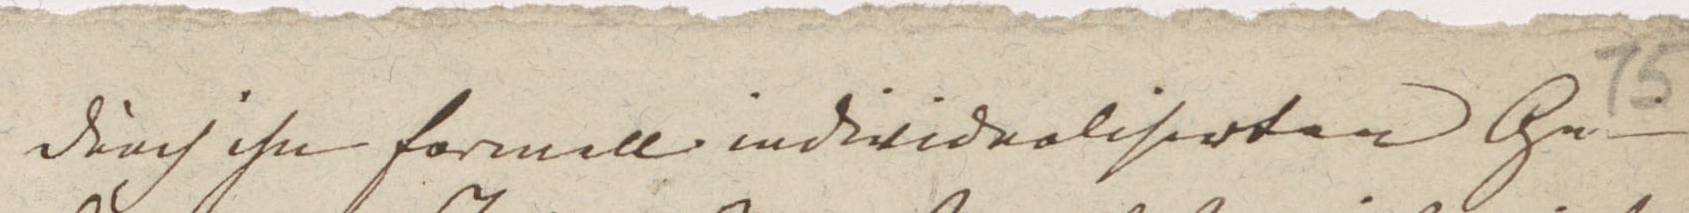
durch ihn formell individualisirten Ge-
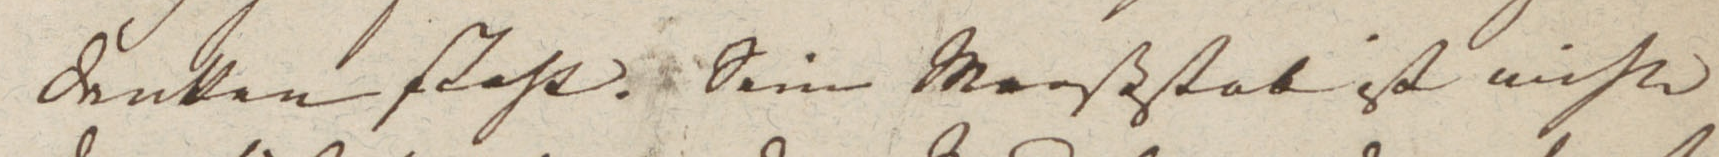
danken steht. Sein Maassstab ist nicht
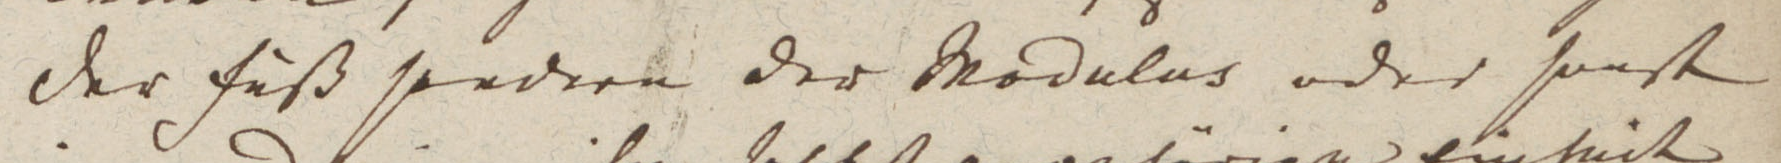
der Fuss sondern der Modulus oder sonst
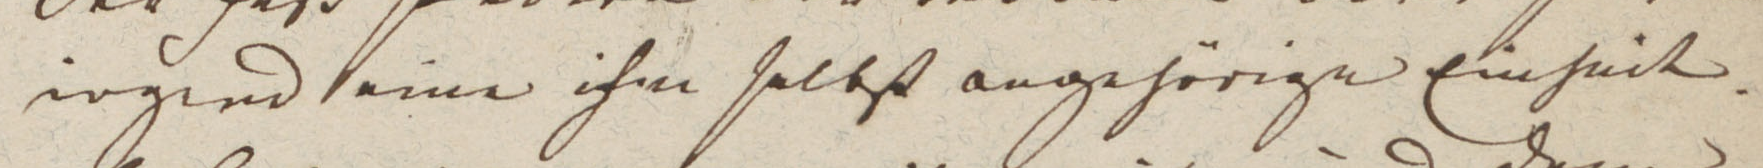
irgend eine ihm selbst angehörige Einheit.
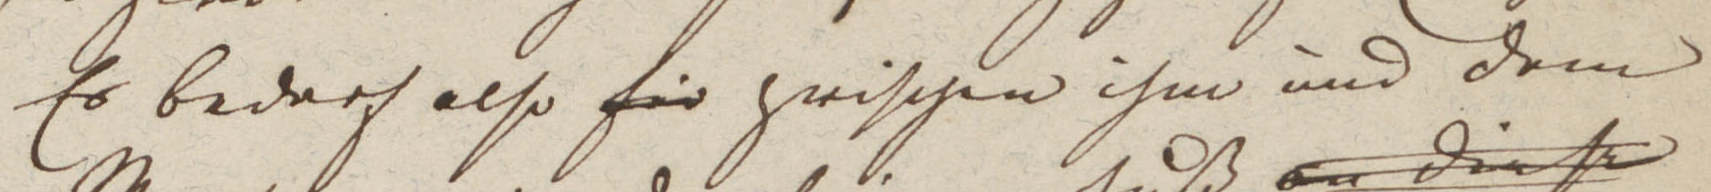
Es bedarf also für zwischen ihm und dem
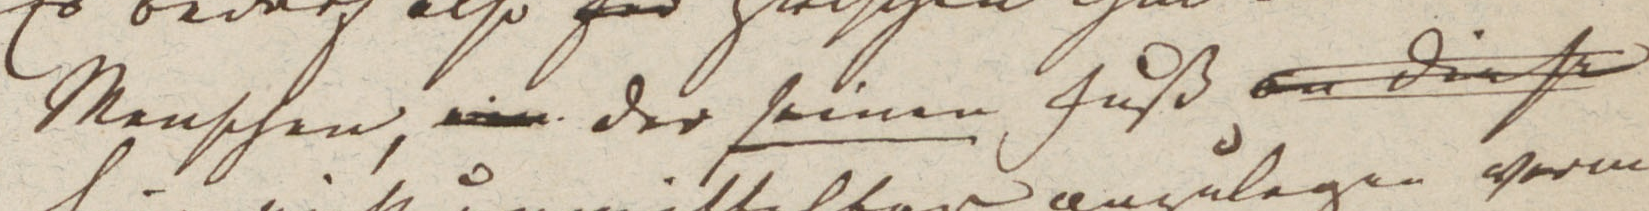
Menschen, ein der seinen Fuss an diese
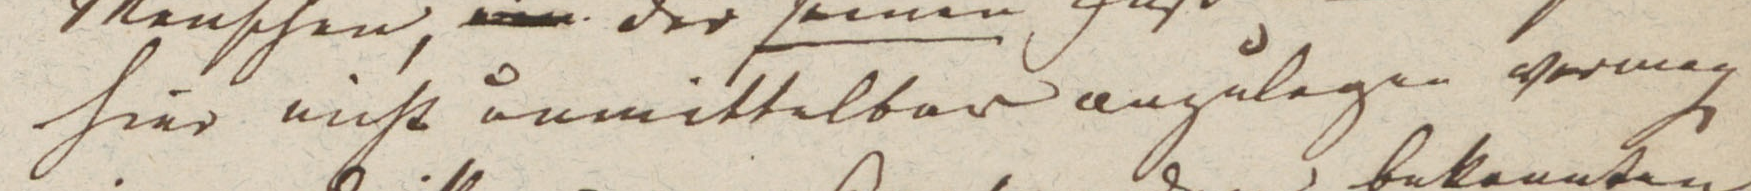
hier nicht unmittelbar anzulegen vermag
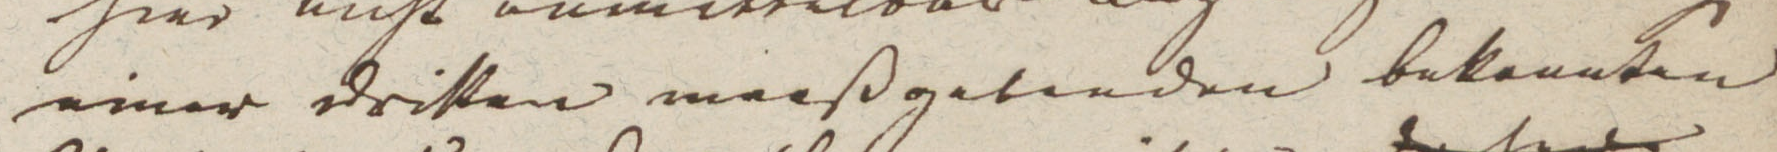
einer Dritten maassgebenden bekannten
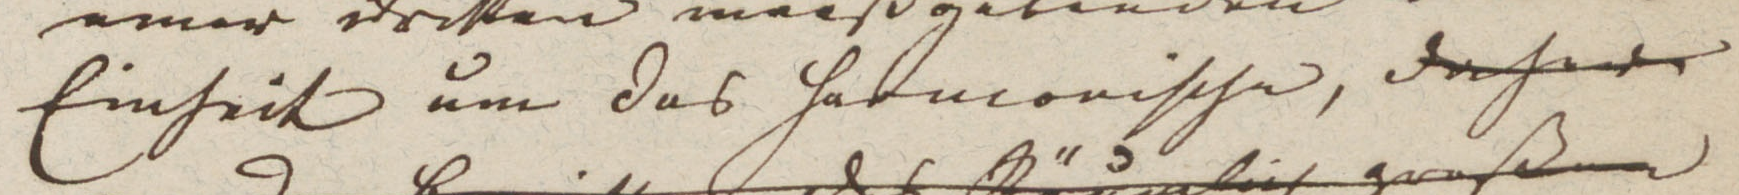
Einheit um das Harmonische, daher
